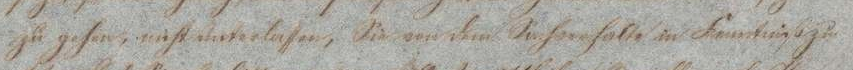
zu gehen, nicht unterlassen, Sie von dem Sachverhalte in Kenntniß zu
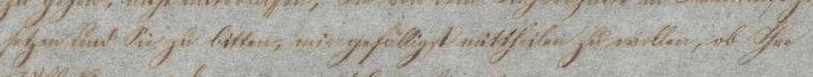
setzen und Sie zu bitten, mir gefälligst mittheilen zu wollen, ob Ihre
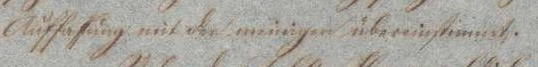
Auffassung mit der meinigen übereinstimmt.
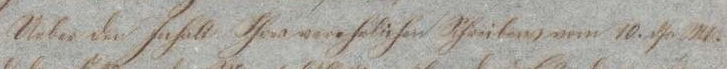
Ueber den Inhalt Ihres verehrlichen Schreibens vom 10. dss Mts.
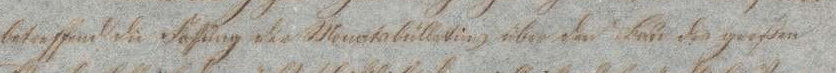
betreffend die Fassung der Monatsbulletins über den Bau des großen
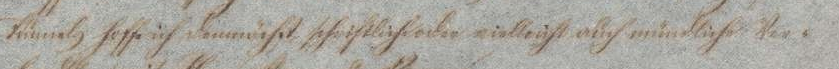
Tunnels hoffe ich demnächst schriftliche oder vielleicht auch mündliche Ver-
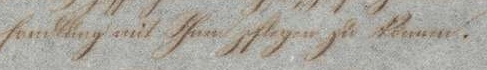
handlung mit Ihnen pflegen zu können.
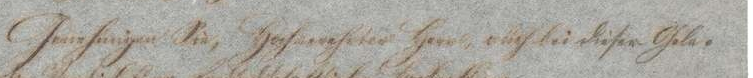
Genehmigen Sie, Hochverehrter Herr, auch bei dieser Gele-
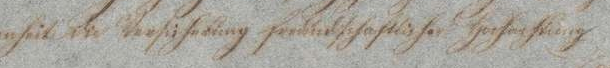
genheit die Versicherung freundschaftlicher Hochachtung
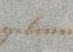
Ihres ergebenen
